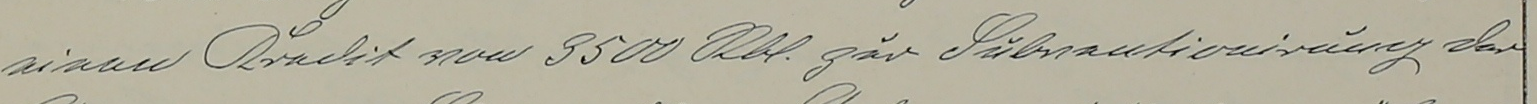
einen Kredit von 3500 Rbl. zur Subventionierung der
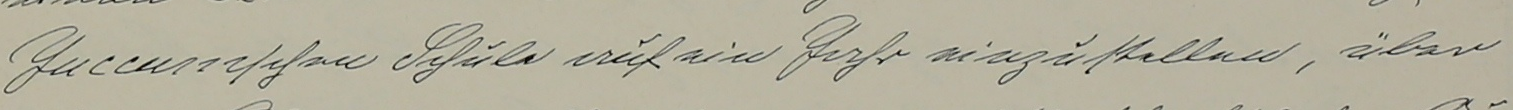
Juccumschen Schule auf ein Jahr einzustellen, über
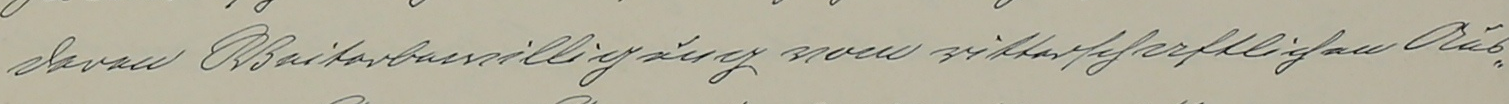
deren Weiterbewilligung vom ritterschaftlichen Aus-
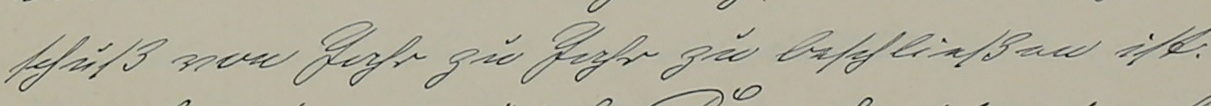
schuß von Jahr zu Jahr zu beschließen ist.
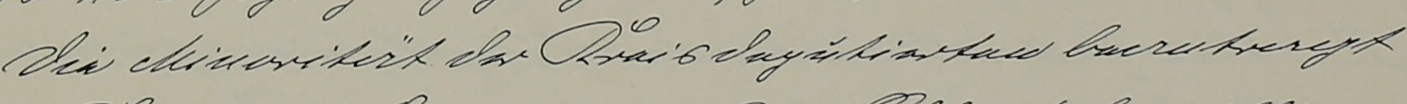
Die Minorität der Kreisdeputierten beantragt
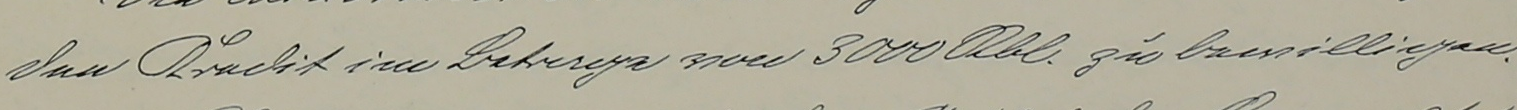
den Kredit im Betrage von 3000 Rbl. zu bewilligen.
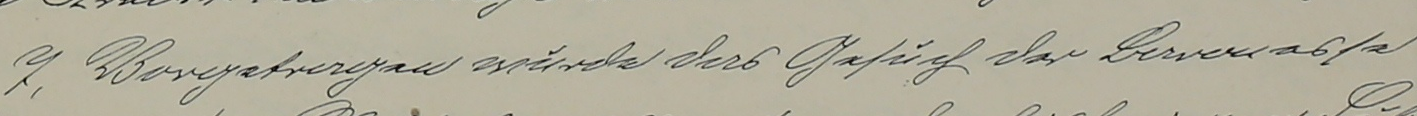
7. Vorgetragen wurde das Gesuch der Baronesse
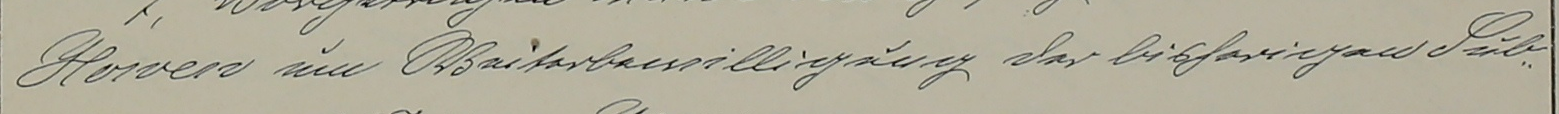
Howen um Weiterbewilligung der bisherigen Sub-
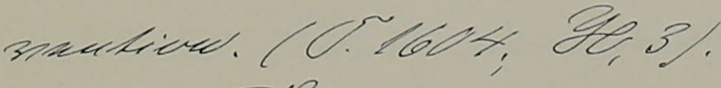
vention. (T.1604; H.3).
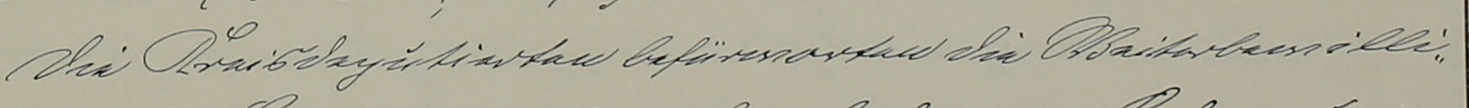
Die Kreisdeputierten befürworten die Weiterbewilli-
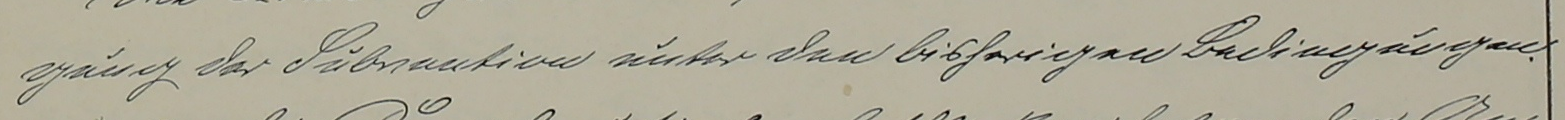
gung der Subvention unter den bisherigen Bedingungen.
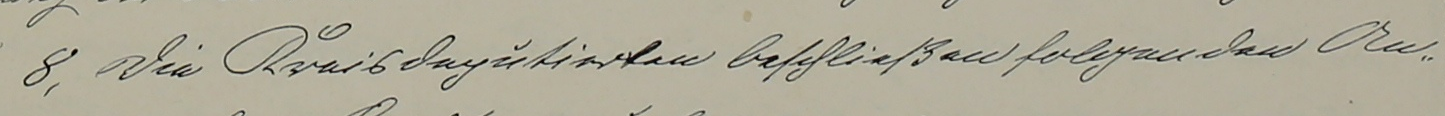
8. Die Kreisdeputierten beschließen folgenden An-
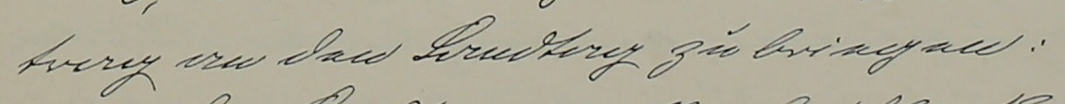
trag an den Landtag zu bringen:
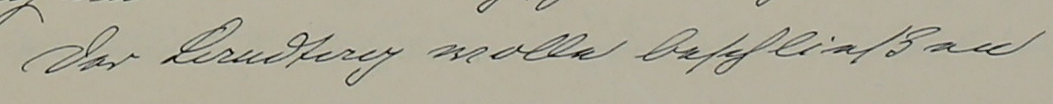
Der Landtag wolle beschließen
